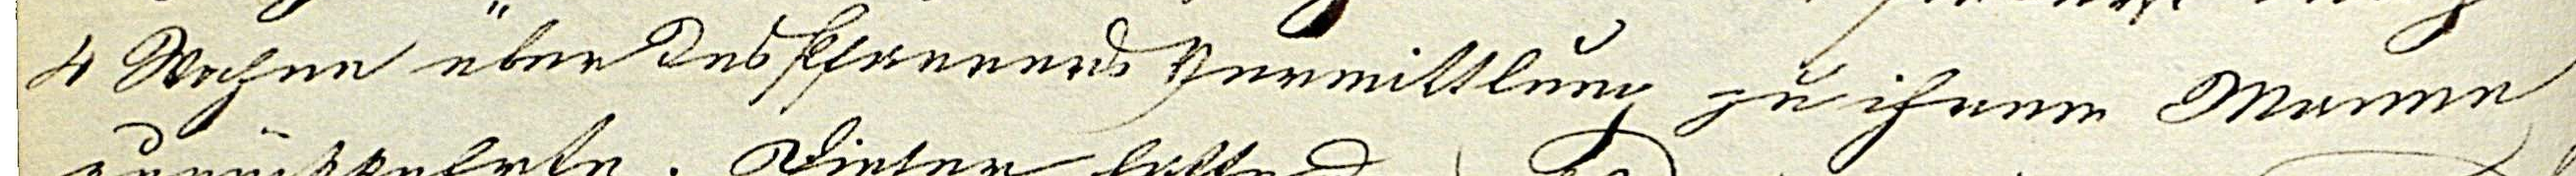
4 Wochen über das Pfarrers Vermittlung zu ihrem Manne
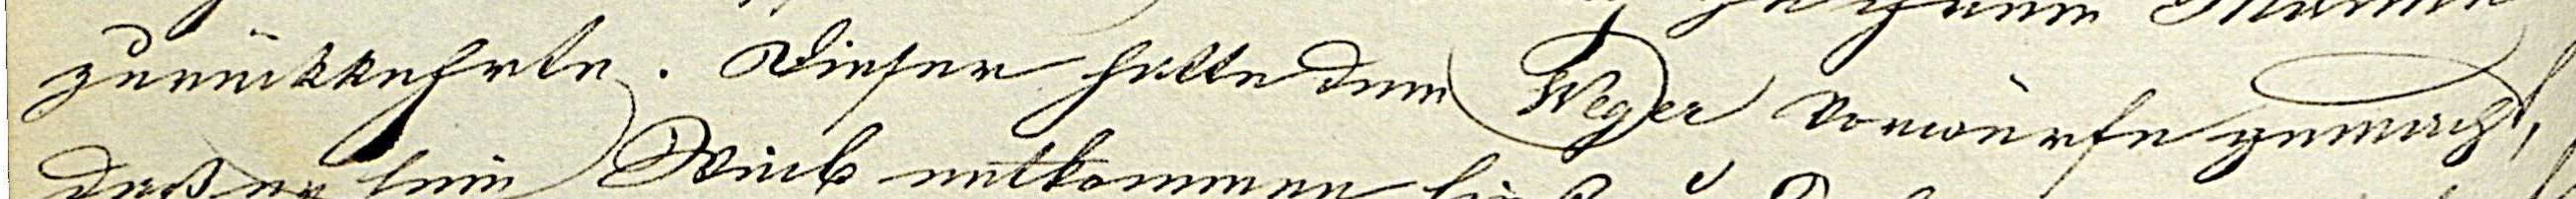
zurückkehrte. Dieser hatte dem Weger Vorwürfe gemacht,
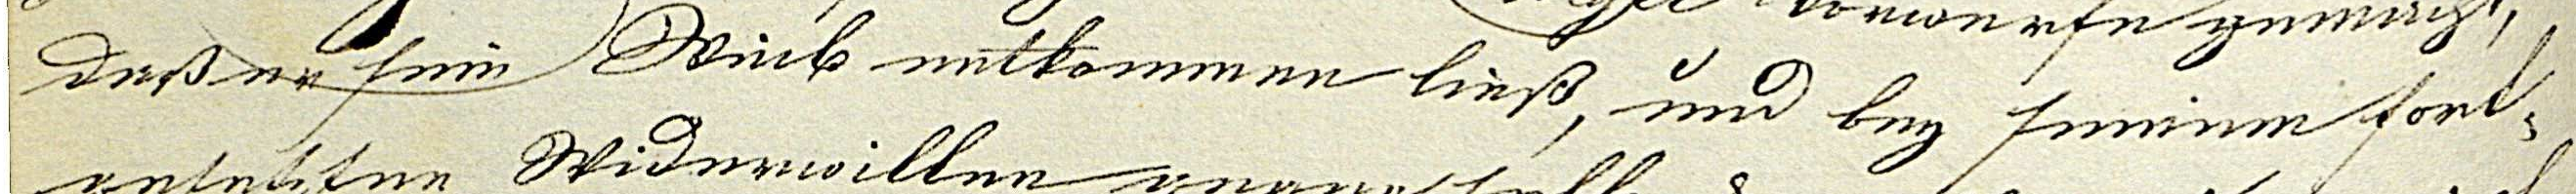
daß er sein Weib entkommen ließ, und bey seinem fort¬
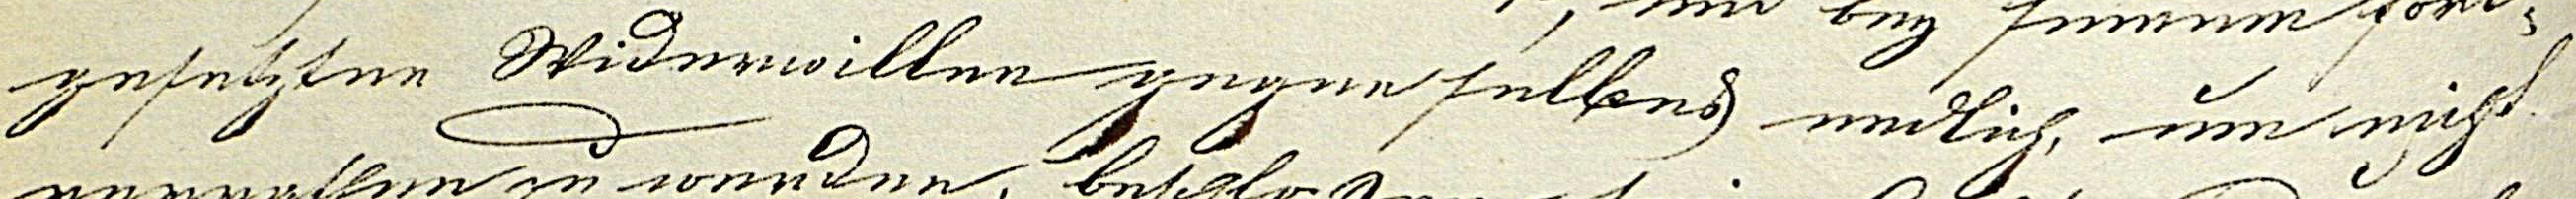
gesetzten Widerwillen gegen selbes endlich, um nicht
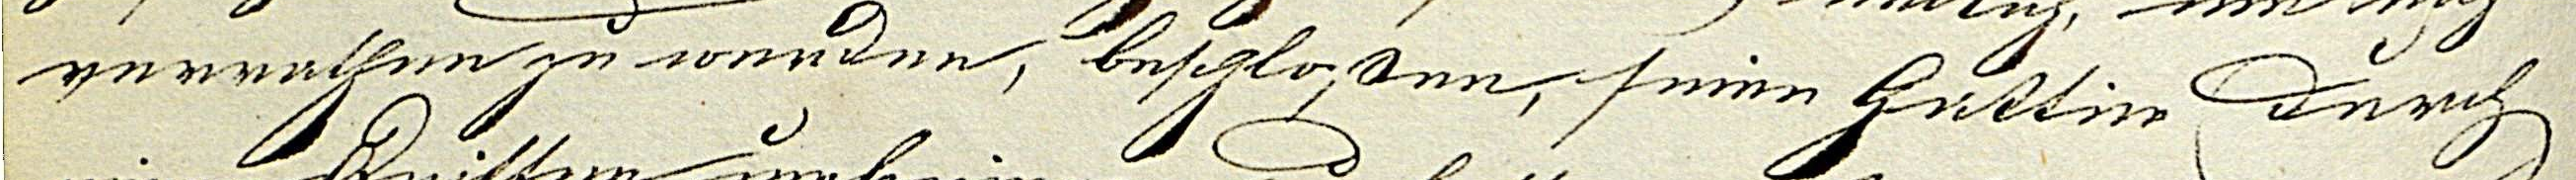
verrahten zu werden, beschloßen, seine Gattin durch
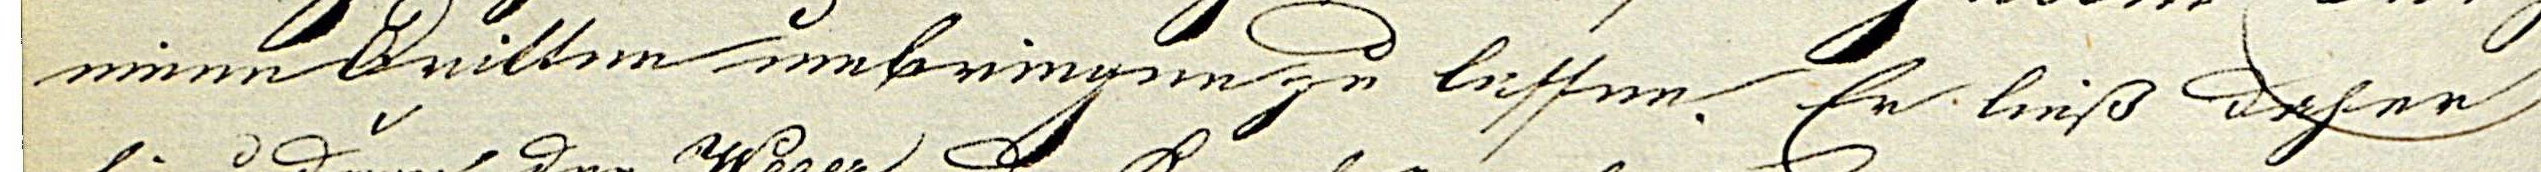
eine Dritten umbringen zu lassen. Er ließ daher
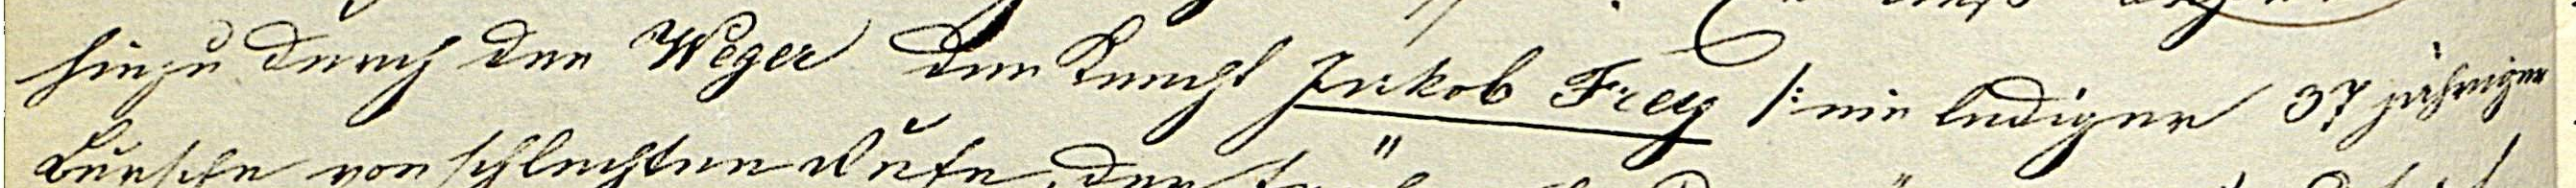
hinzu durch den Weger den Knecht Jakob Frey (ein lediger, 37jähriger
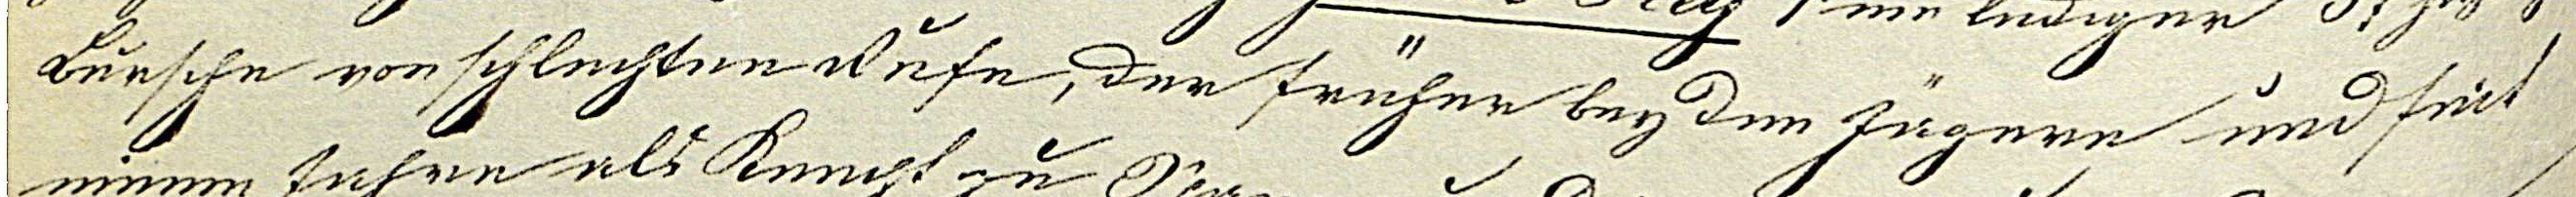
Bursche von schlechten Rufe, der früher bey dem Jägern und seit
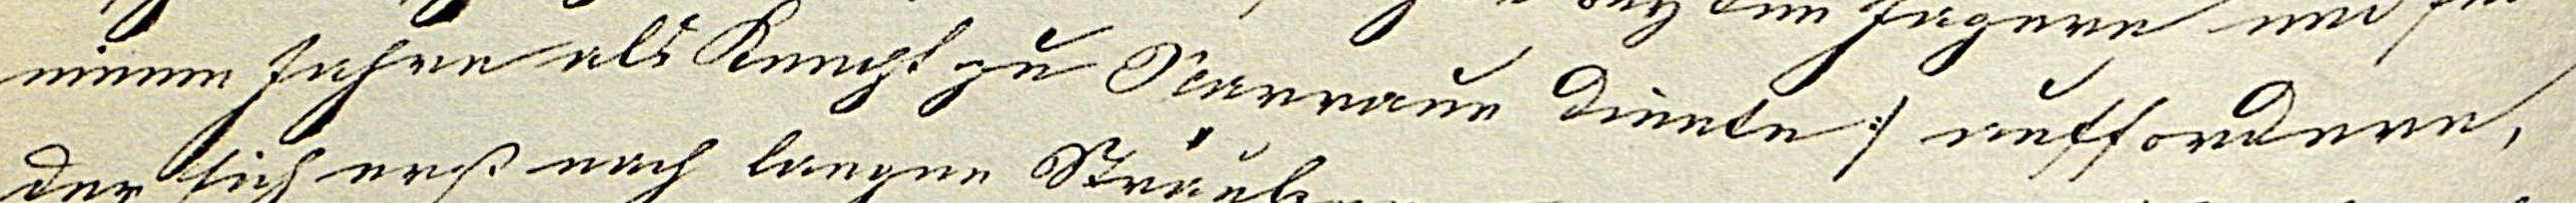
einem Jahre als Knecht zu Narraue diente) auffordern,
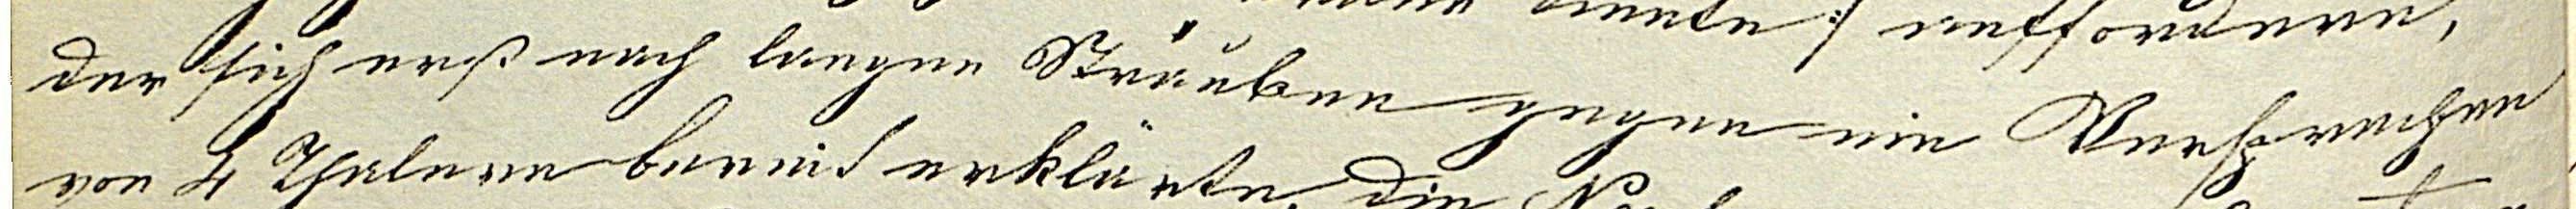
der sich erst nach langen Sträuben gegen ein Versprechen
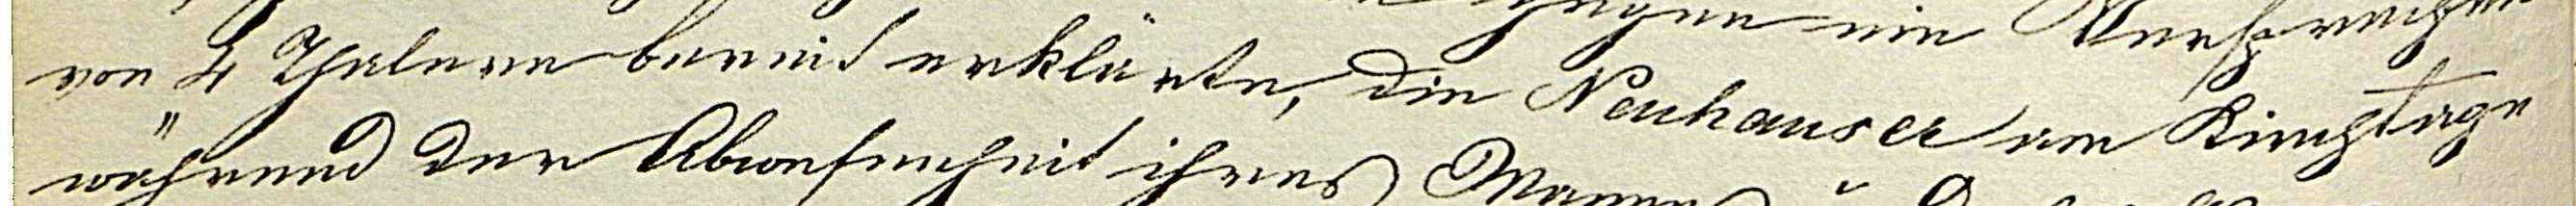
von 4 Thalern bereit erklärte, die Neuhauser am Kirchtage
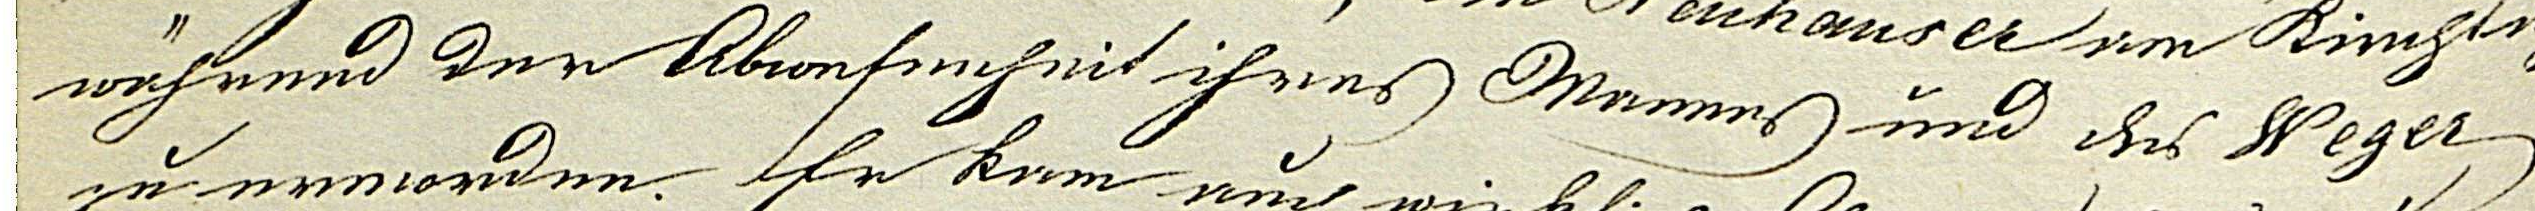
während der Abwesenheit ihres Mannes und des Weger
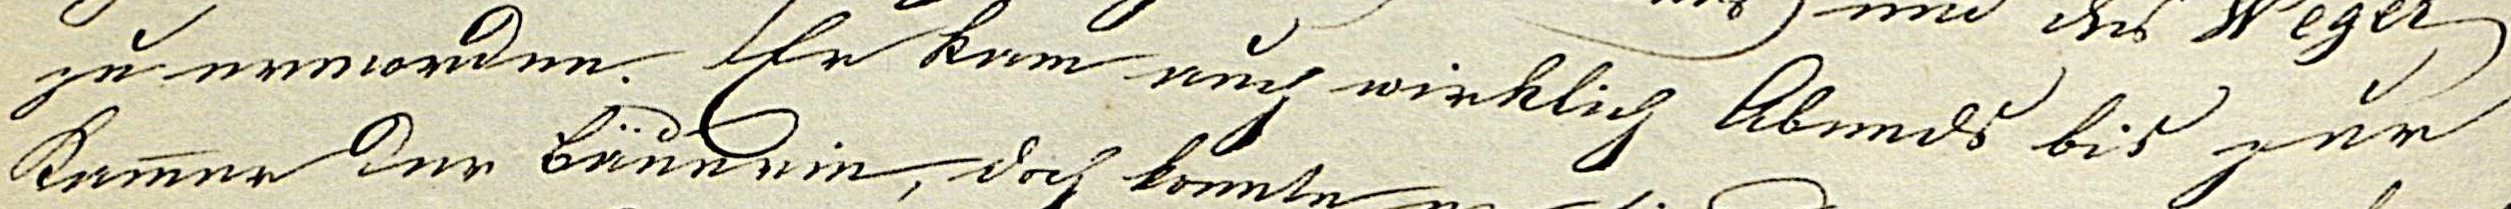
zu ermorden. Er kam auch wirklich Abends bis zur
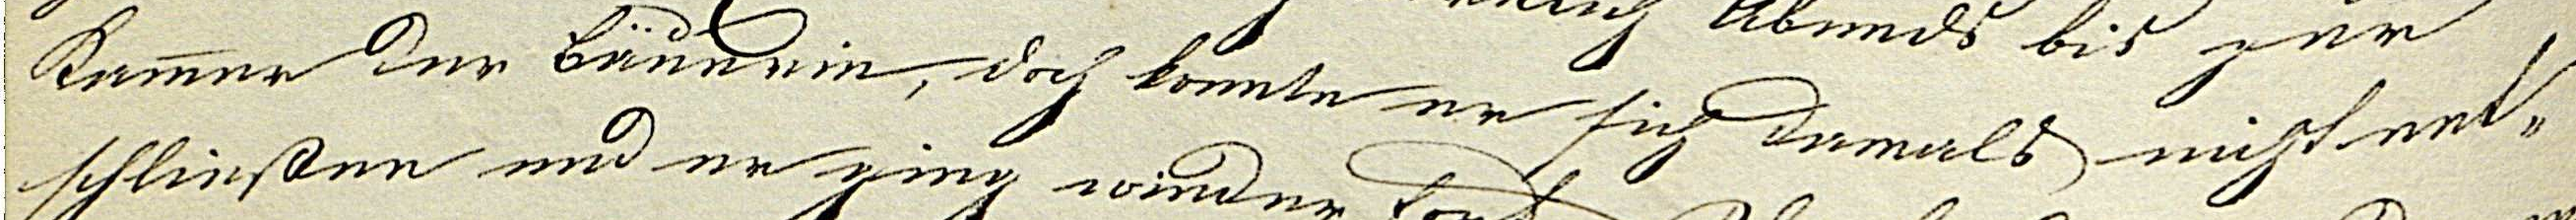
Kammer der Bäuerin, doch konnte er sich damals nicht ent¬
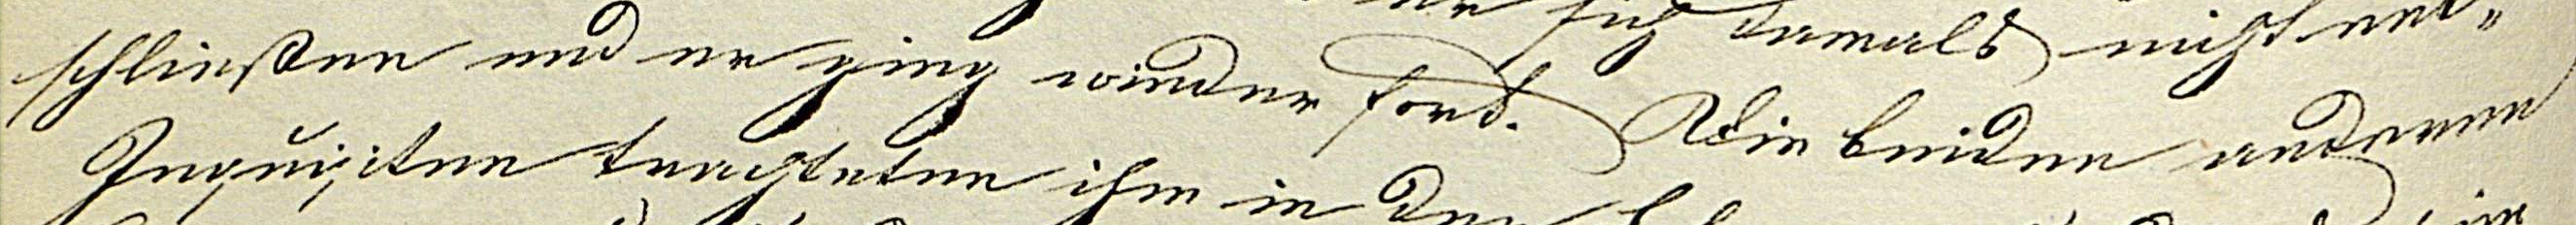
schließen und er ging wieder fort. Die beiden anderen
